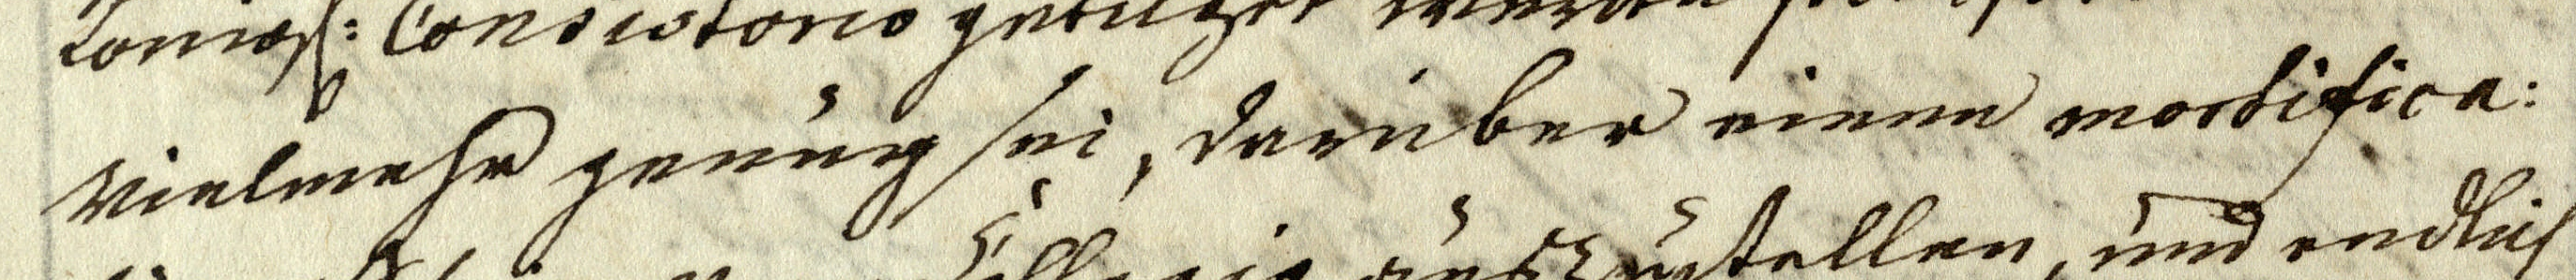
vielmehr genug sei, darüber einen mortifica¬
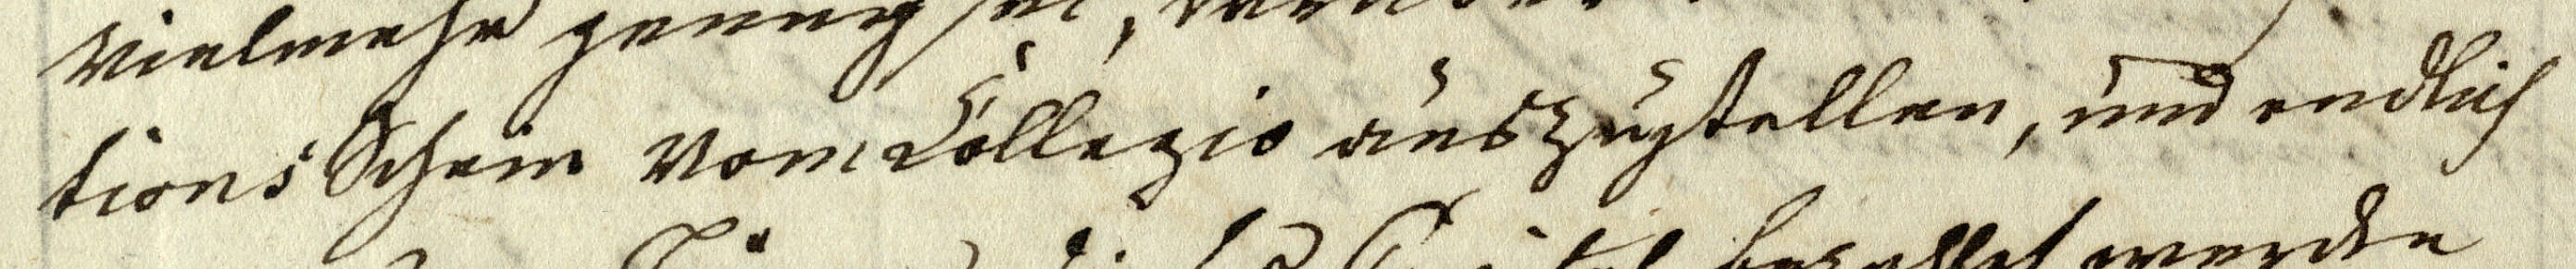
tions Schein vom Collegio auszustellen, und endlich
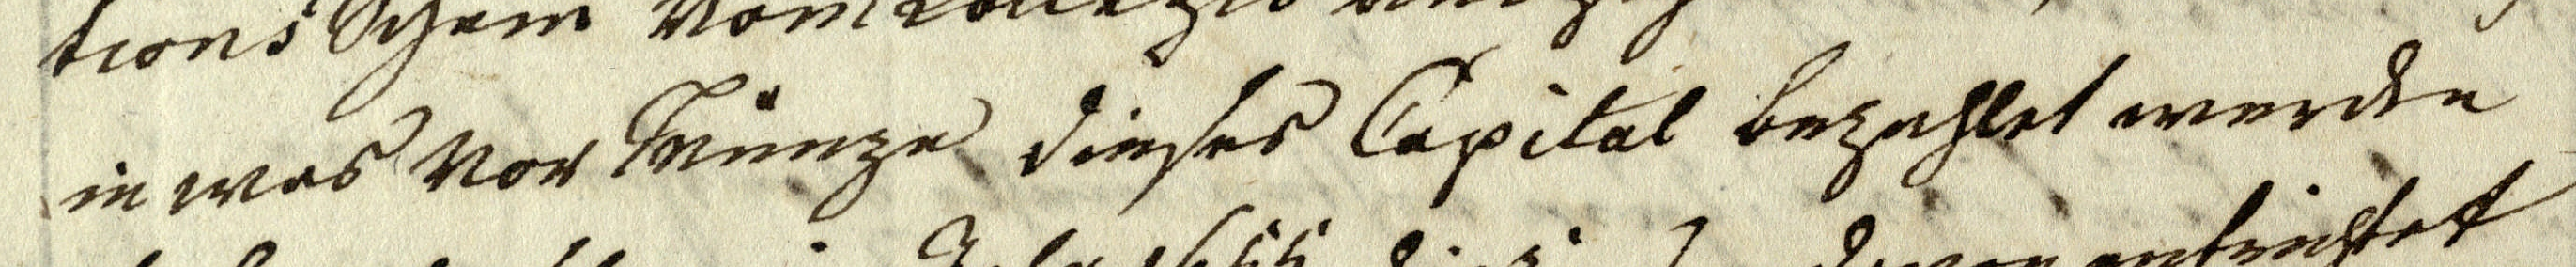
in was vor Münze dieses Capital bezahlet werden
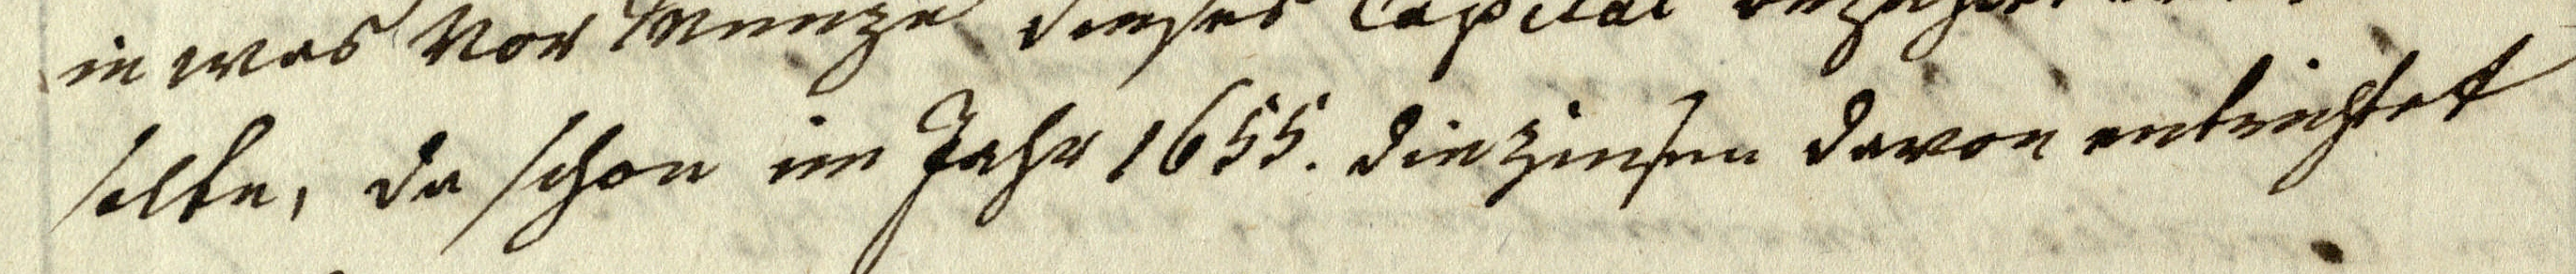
solte, da schon im Jahr 1655. die Zinsen davon entrichtet
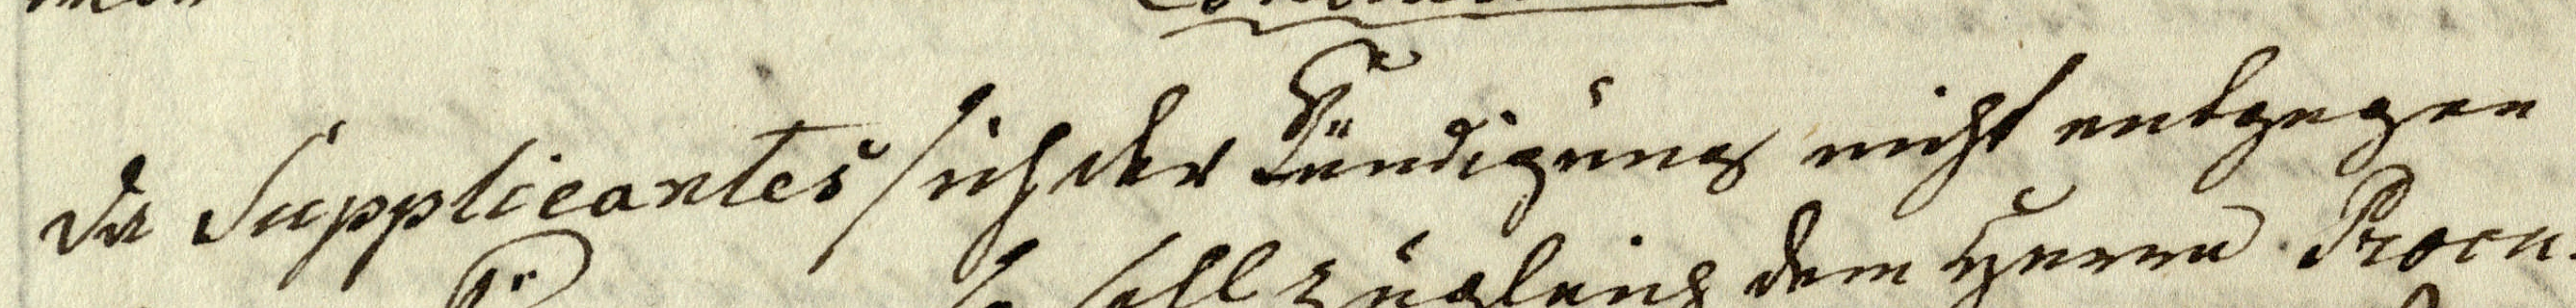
Da Supplicantes sich der Kündigung nicht entgegen
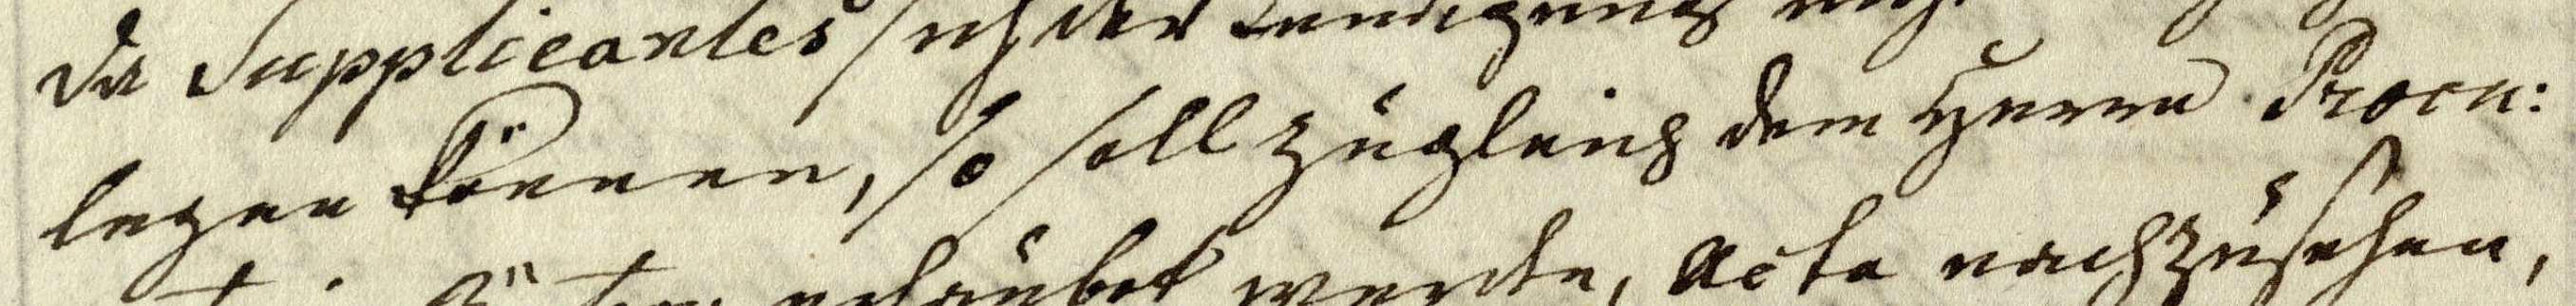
legen könen, so soll zugleich dem Herrn Procu¬
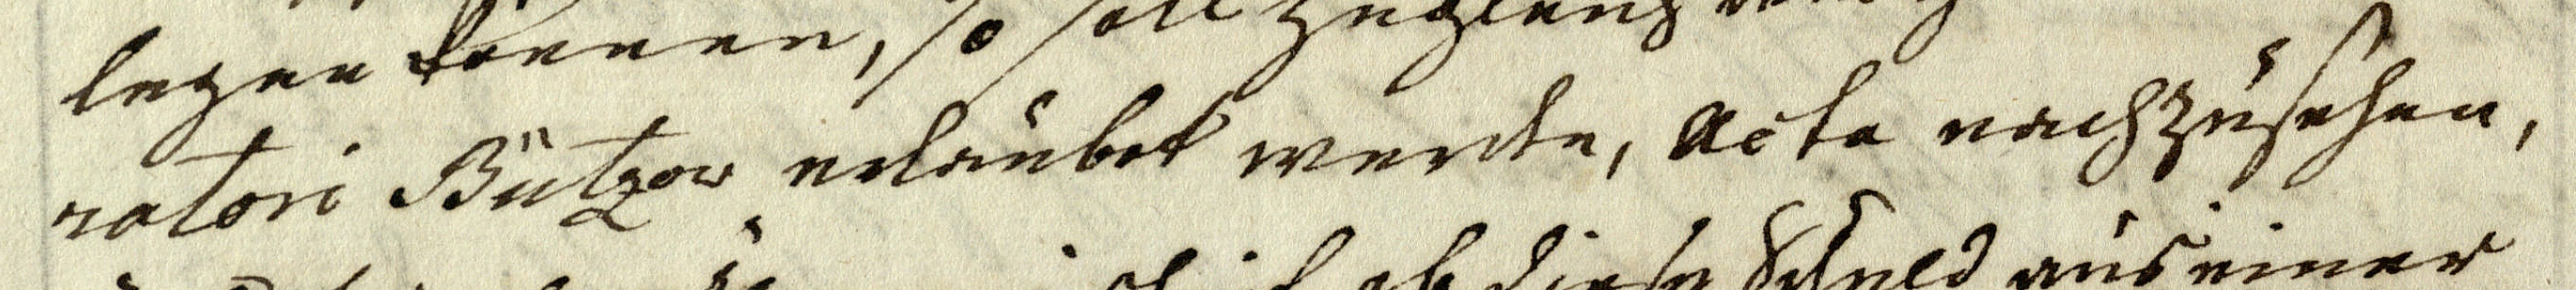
ratori Bützow erlaubet werden, Acta nachzusehen,
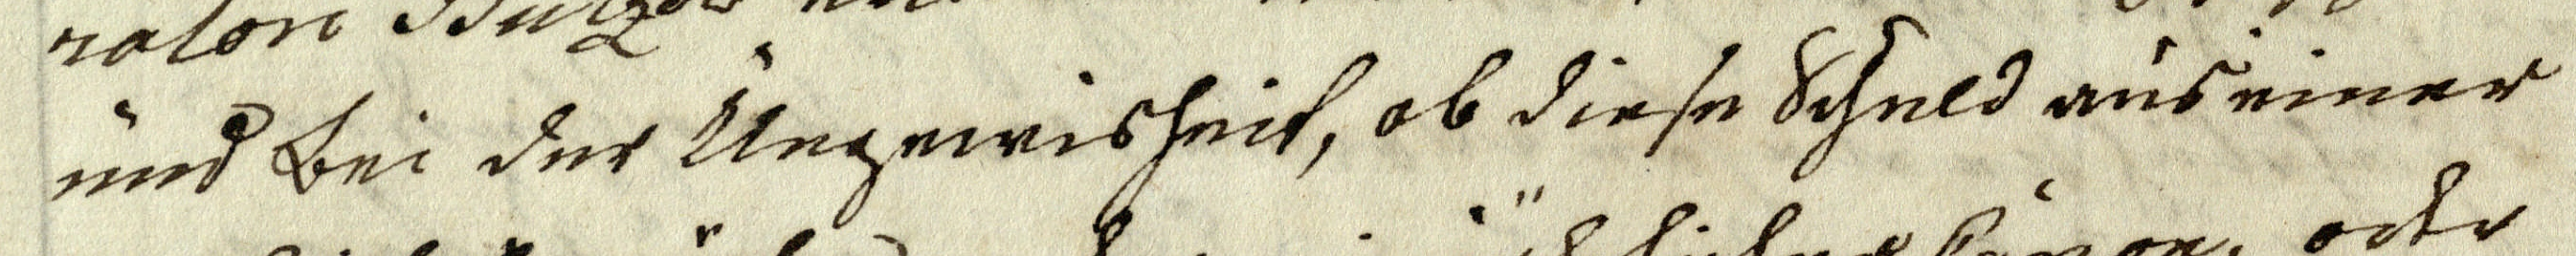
und bei der Ungewisheit, ob diese Schuld aus einer
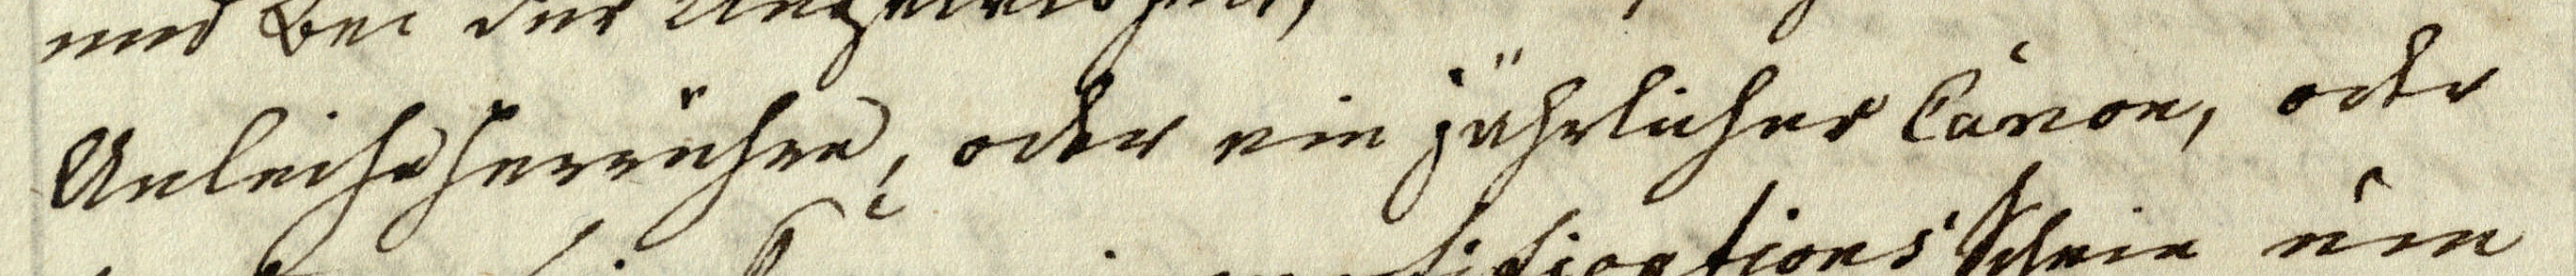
Anleihe herrühre, oder ein jährlicher Canon, oder
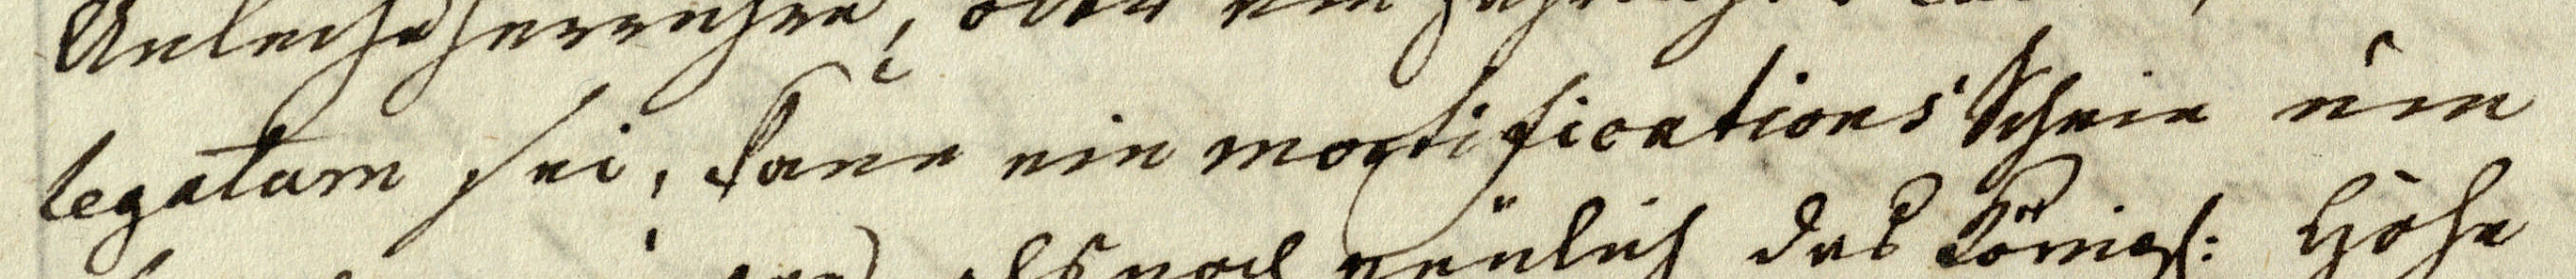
legatum sei, kann ein mortifications Schein um
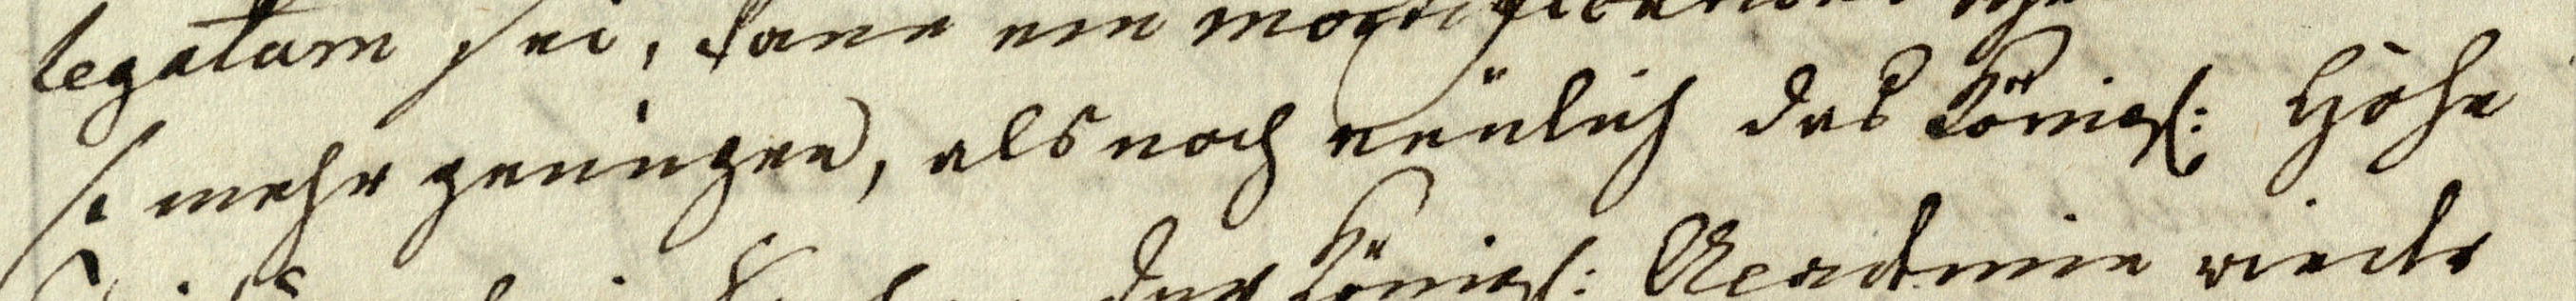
so mehr genügen, als noch neulich das Königl. Hohe
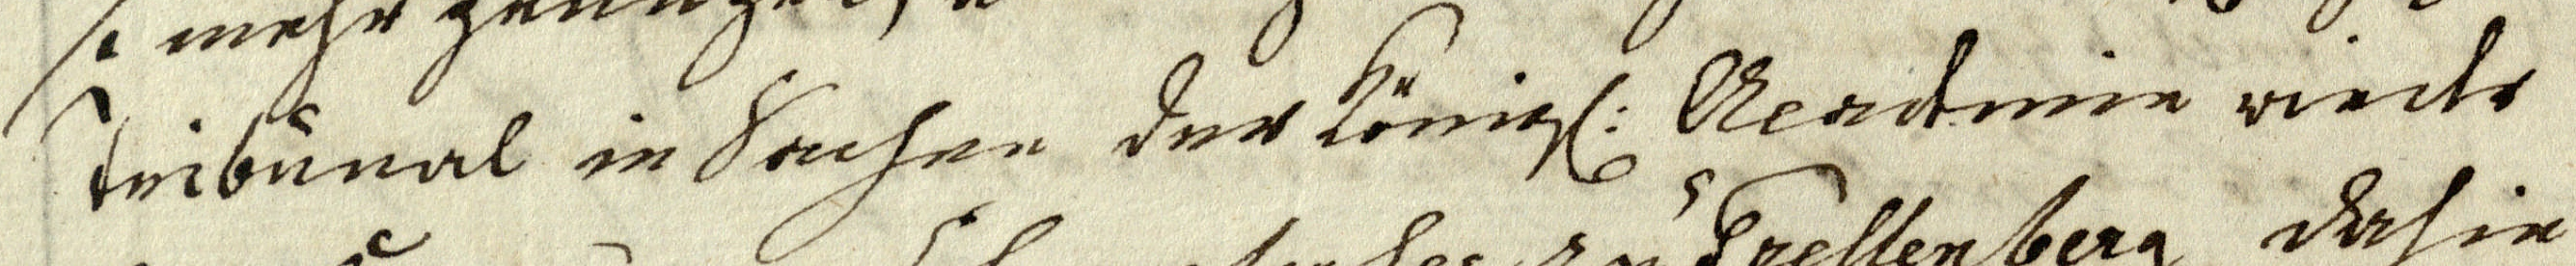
Tribunal in Sachen der Königl. Academie wieder
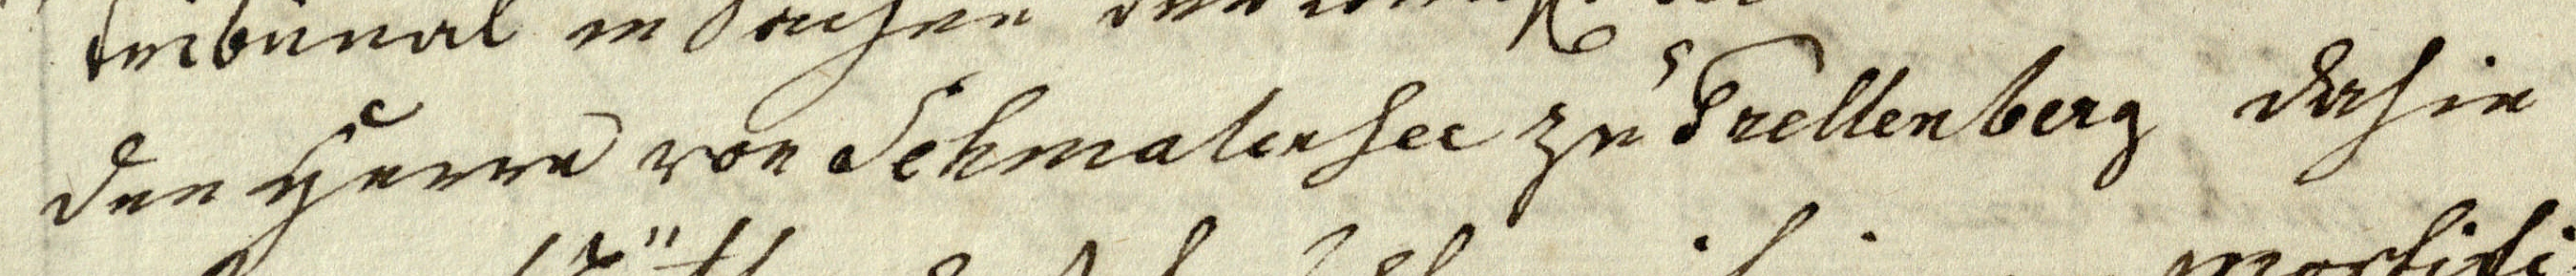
den Herrn von Schmalensee zu Grellenberg dahin
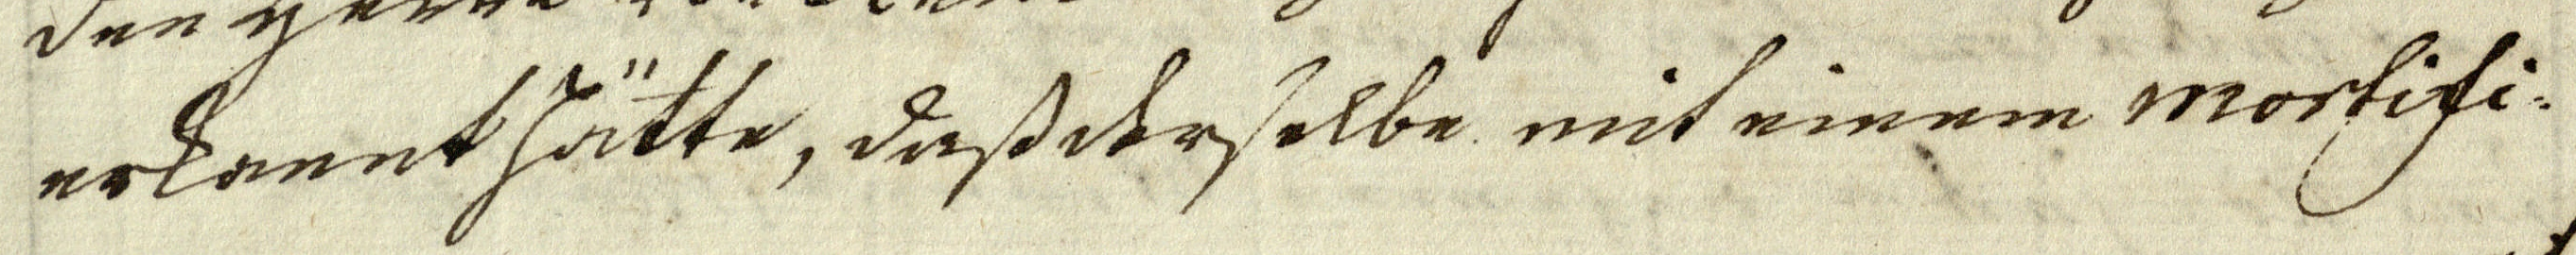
erkannt hätte, daß derselbe mit einem mortifi¬
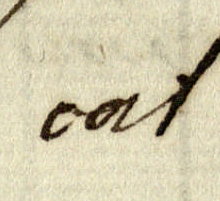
cat
